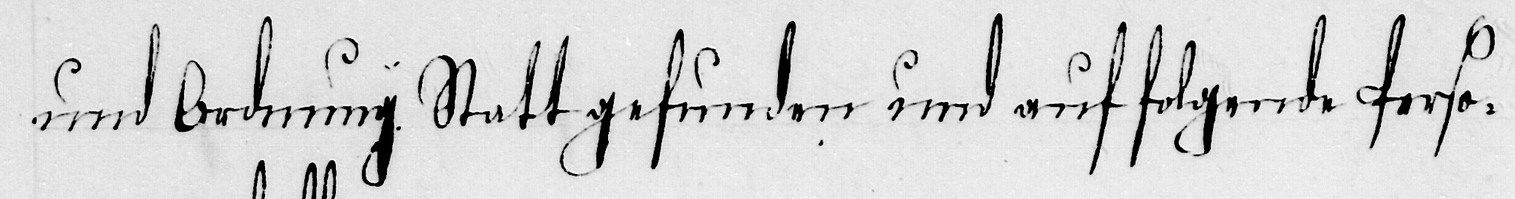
und Ordnung Statt gefunden und auf folgende Perso¬
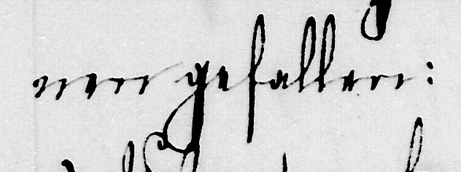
nen gefallen:
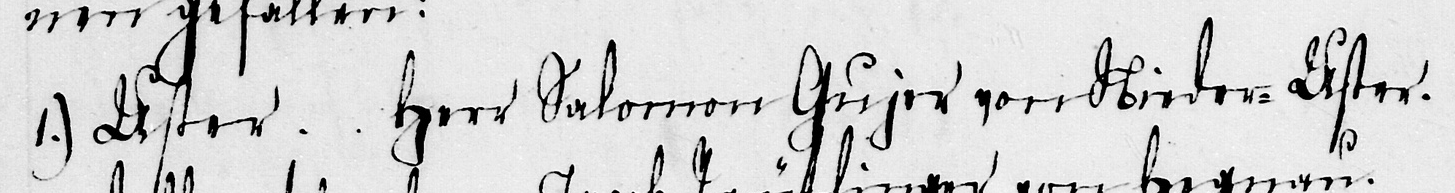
1.) Uster Herr Salomon Gujer von Nieder-Uster.
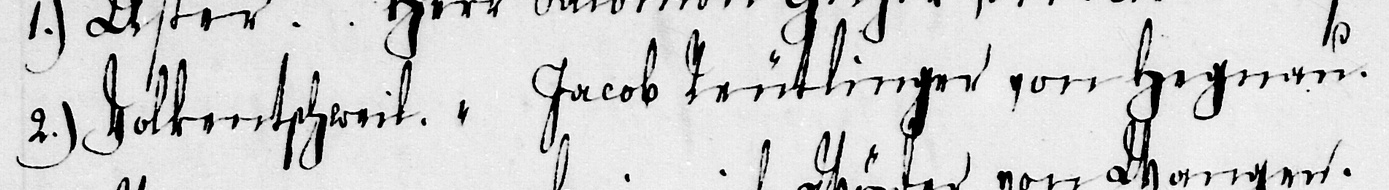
2.) Volkentschweil “ Jacob Reutlinger von Hegnau.
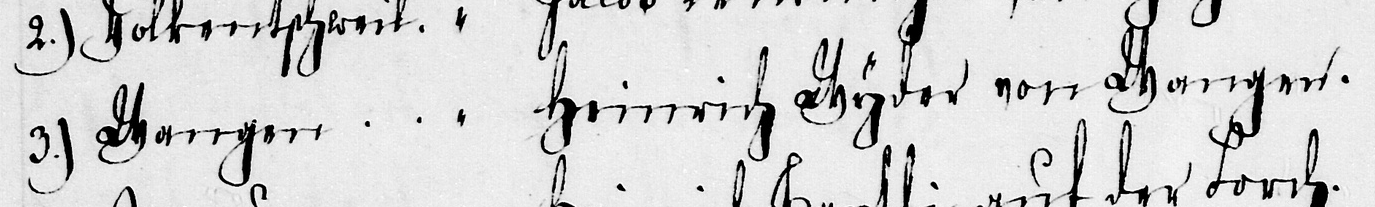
3.) Wangen “ Heinrich Wyder von Wangen.
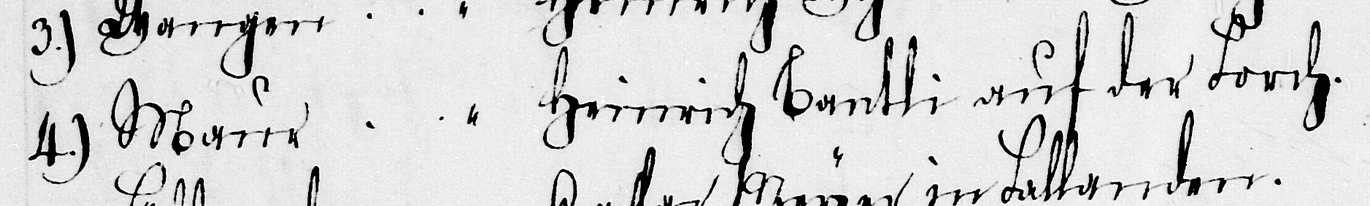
4.) Maur “ Heinrich Bantli auf der Forch.
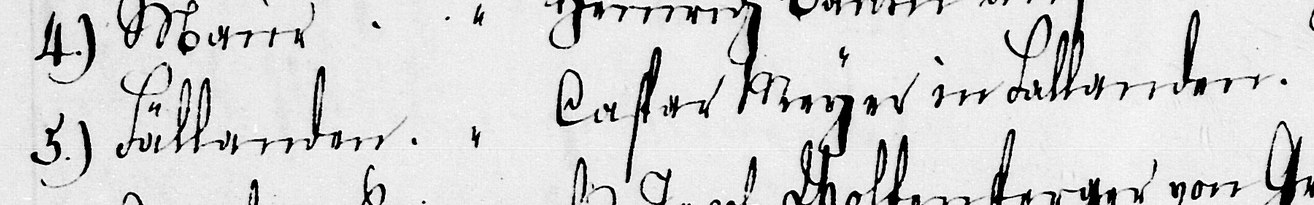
5.) Fällanden “ Caspar Meyer in Fallanden
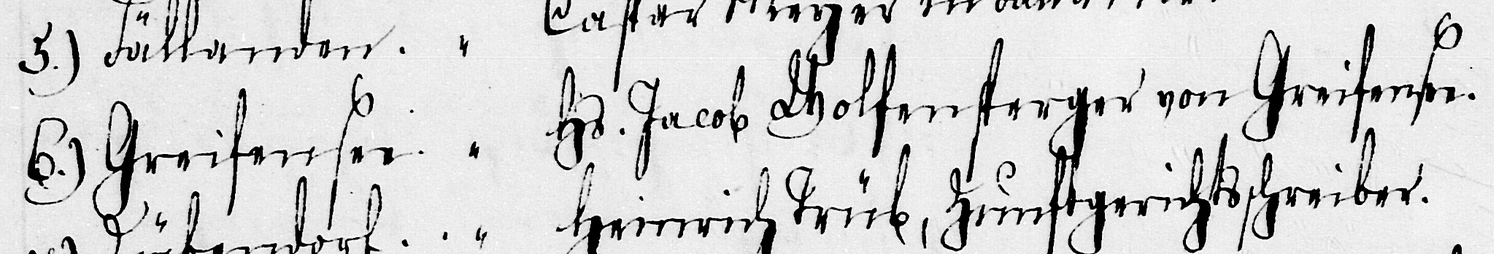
6.) Greifensee “ Hs. Jacob Wolfensperger von Greifense¬
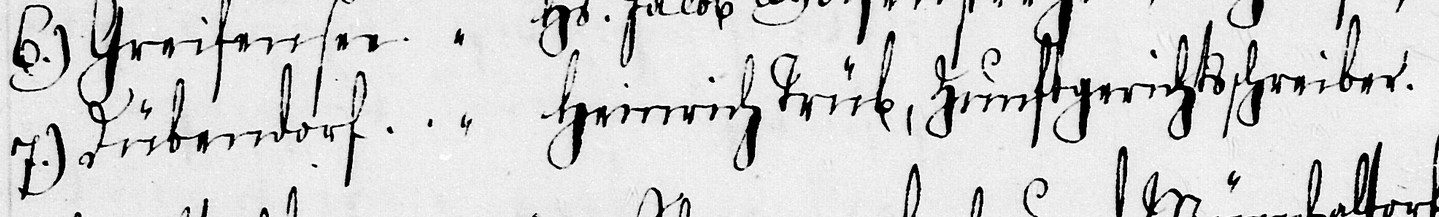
7.) Dübendorf “ Heinrich Trüb, Zunftgerichtsschreiber.
